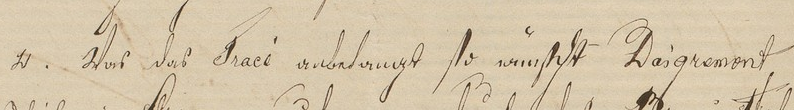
4. Was das Tracé anbelangt so wünscht Daigremont
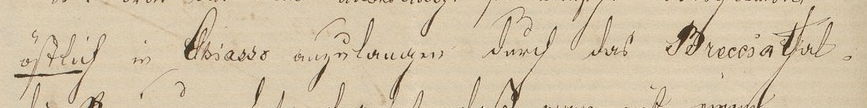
östlich in Chiasso anzulangen durch das Brecciathal.
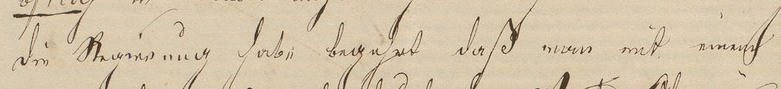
Die Regierung habe begehrt daß man mit einem
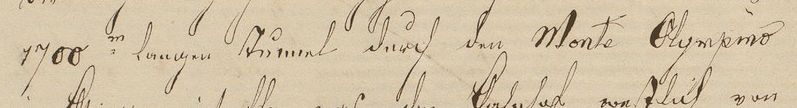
1700m langen Tunnel durch den Monte Olympino
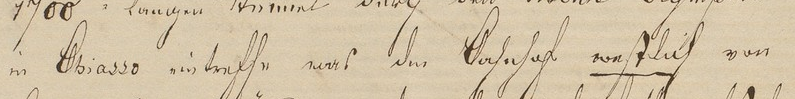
in Chiasso eintreffe was den Bahnhof westlich von
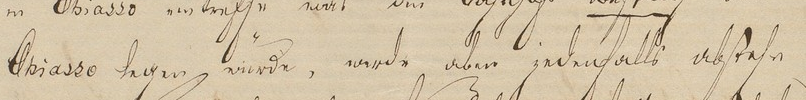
Chiasso legen würde, werde aber jedenfalls abstehn.
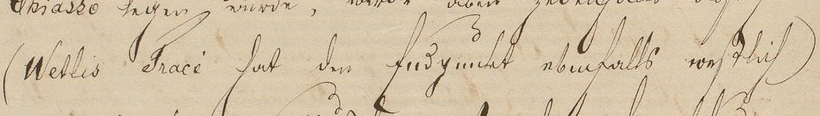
(Wetlis Tracé hat den Endpunkt ebenfalls westlich)
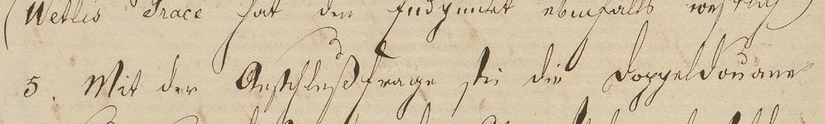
5. Mit der Anschlußfrage sei die Doppeldouane
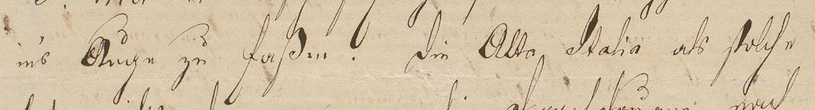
ins Auge zu faßen. Die Alta Italia als solche
